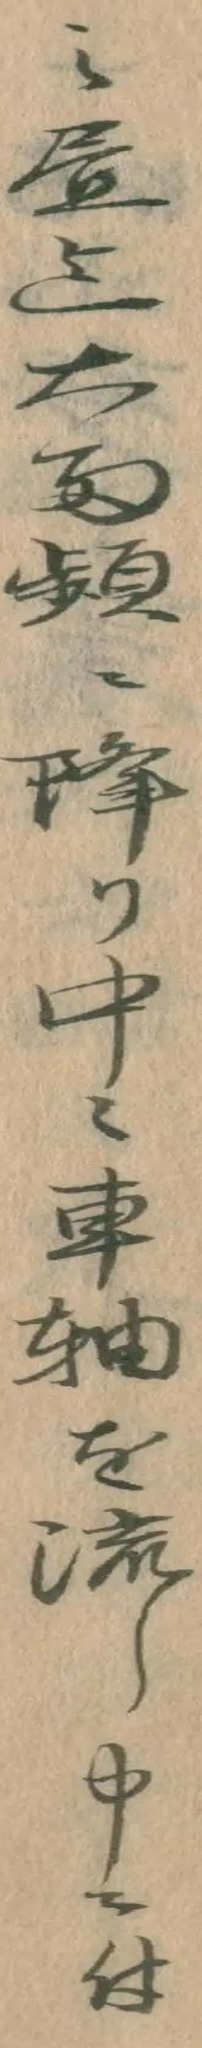之昼迄大雨頻に降り中々車軸を流し申に付
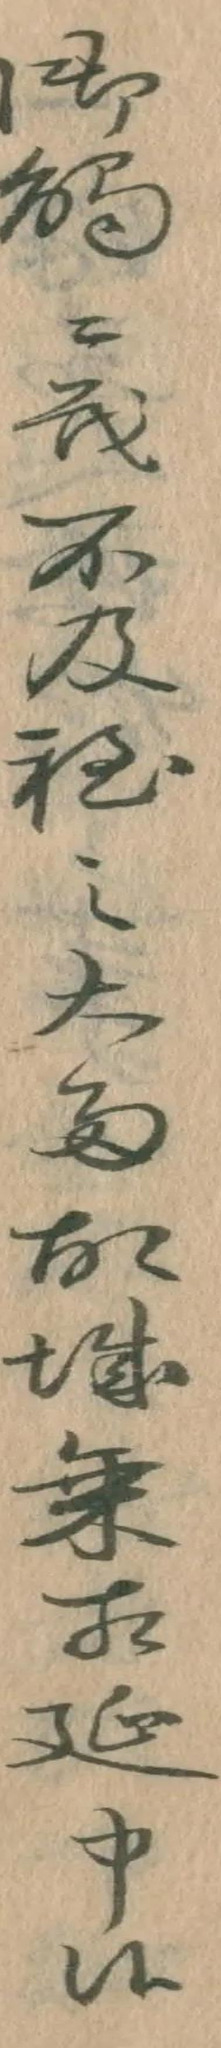御触に茂不及程之大雨故城乗相延申候
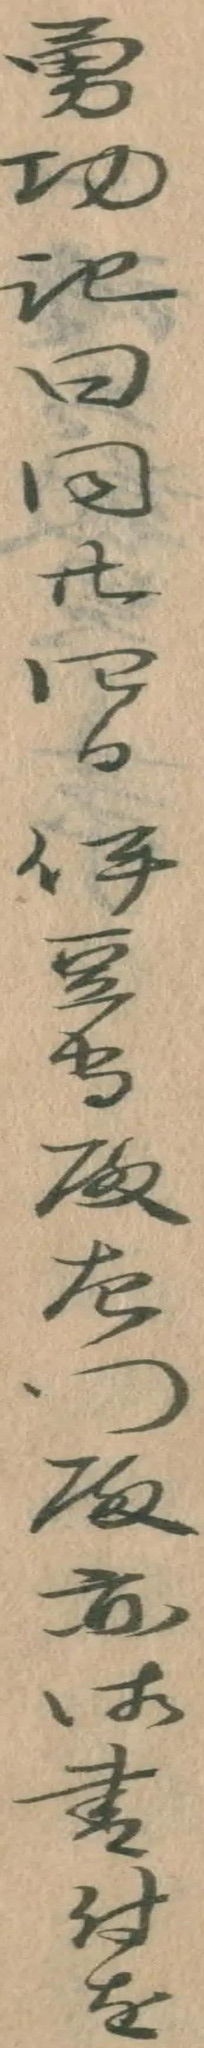勇功記曰同廿四日伊豆守殿左門殿亦御書付を
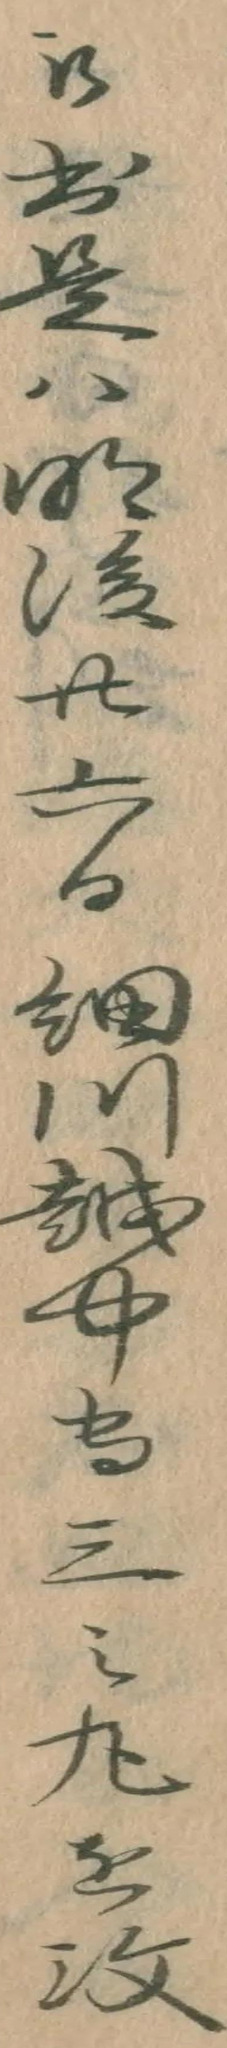被出是は明後廿六日細川越中守三之丸を攻
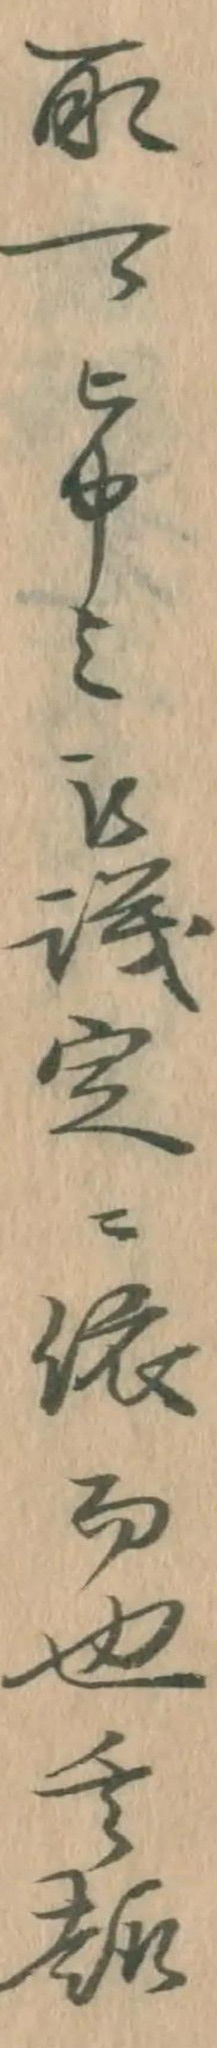取可被申与被議定に依而也其趣

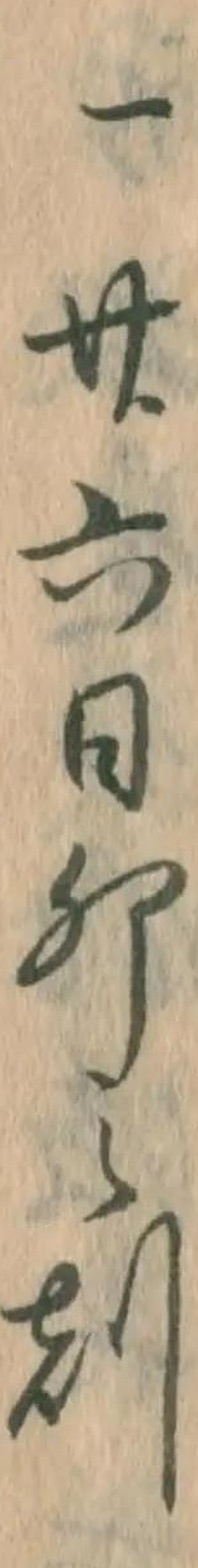一廿六日夘之刻
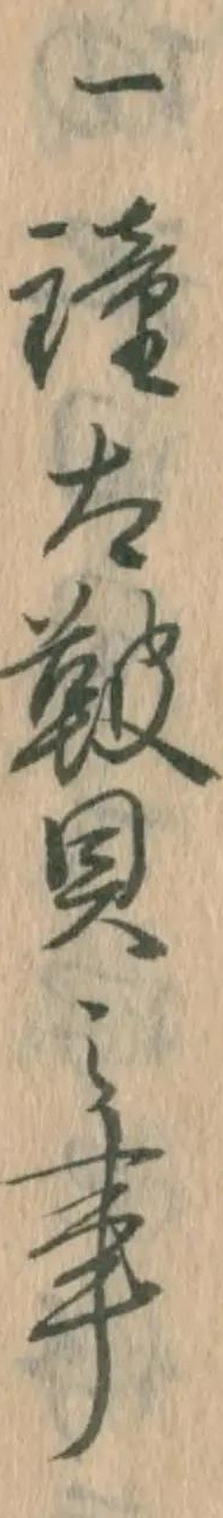一鐘太皷貝之事
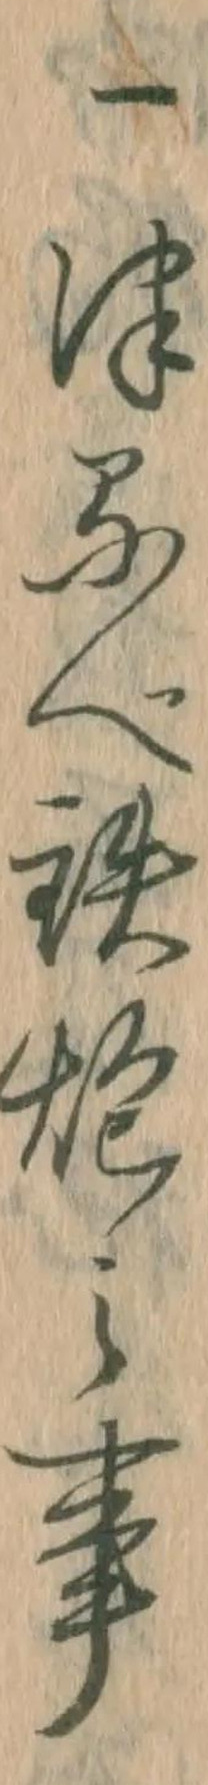一津累べ鉄炮之事
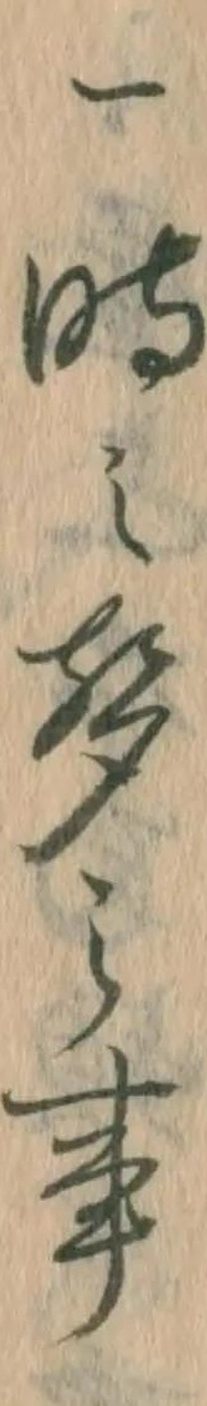一時之声之事
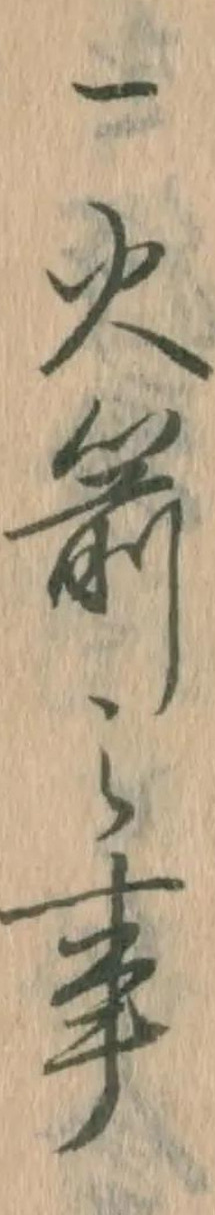一火箭之事
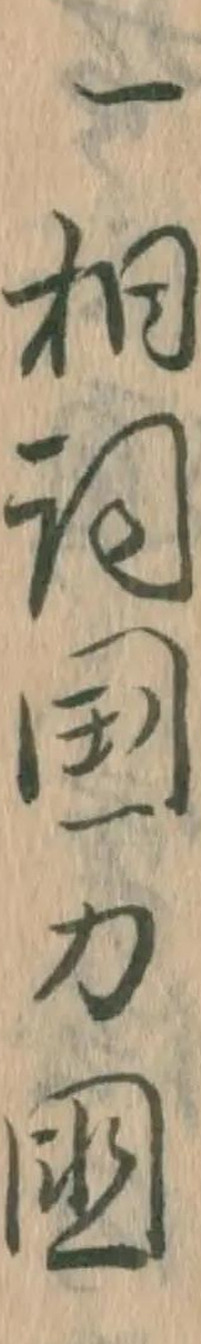一相詞国刀国
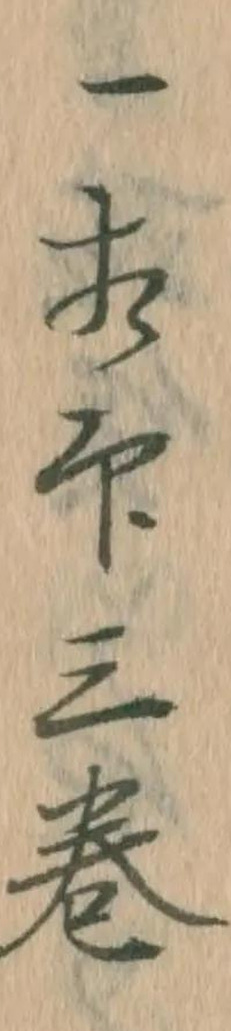一相印三巻
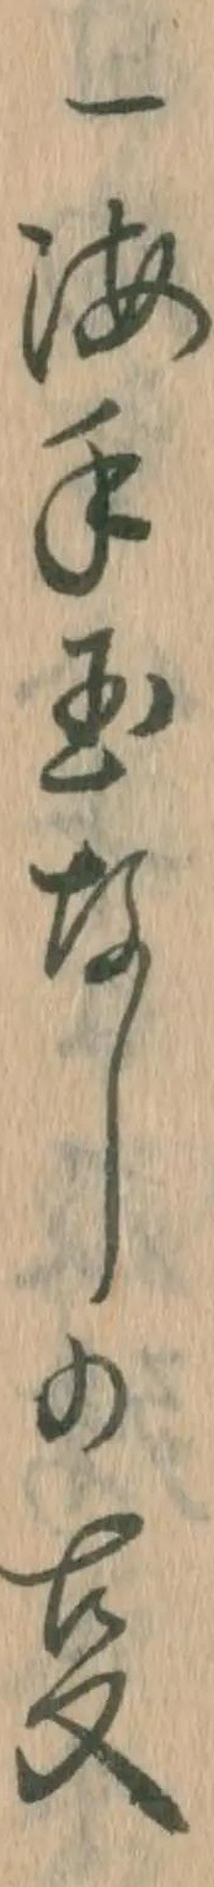一海手玉なしの事
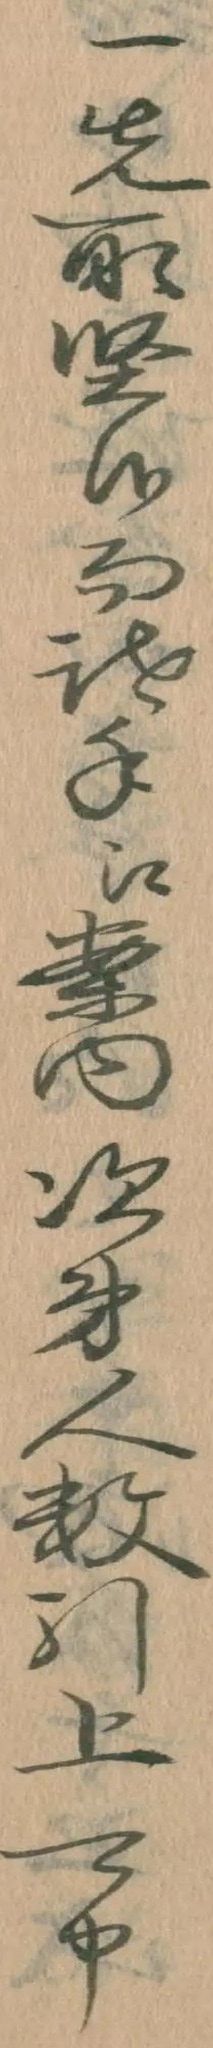一先取堅候而諸手江案内次第人数引上可申
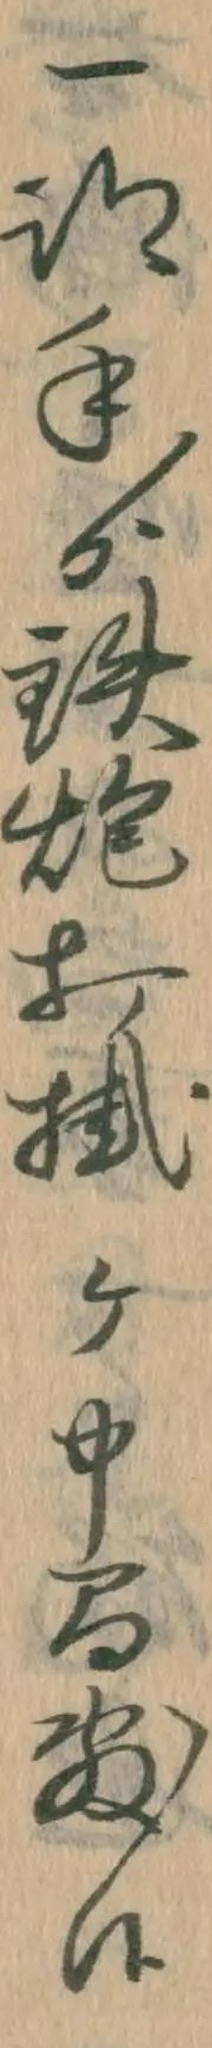一跡手ゟ鉄炮打掛け申間敷候
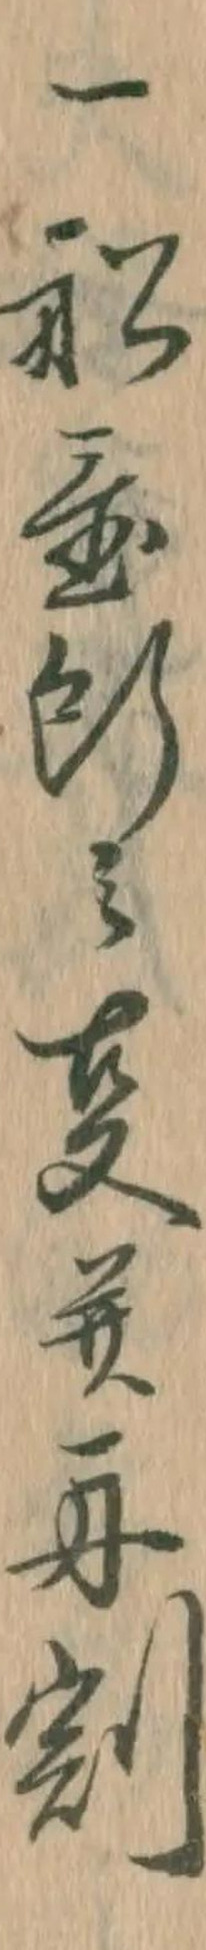一私置所之事幷舟割
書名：切支丹御退治記 49巻. [7]
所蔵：国立国会図書館 National Diet Library, JAPAN
